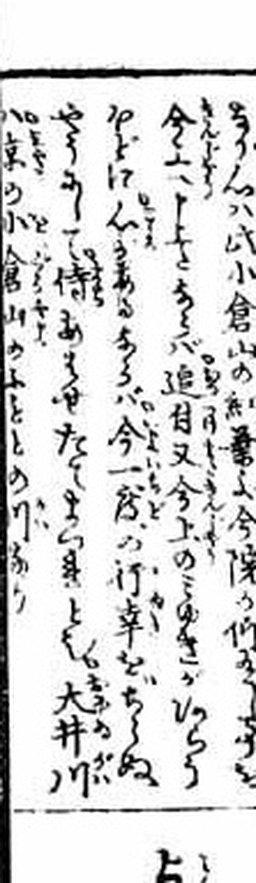ほどに心があるならば今一度の行幸をちらぬ信
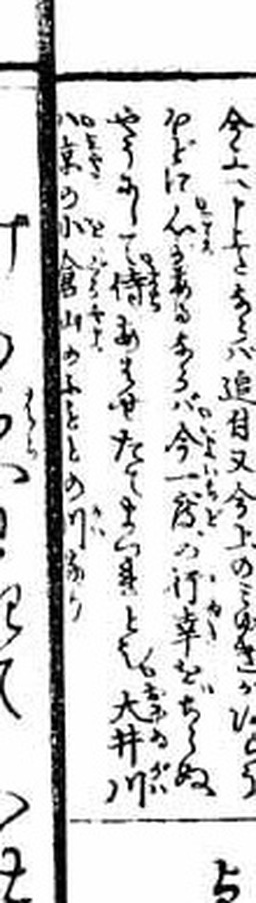やうにして侍あはせたてまつれと也大井川は公
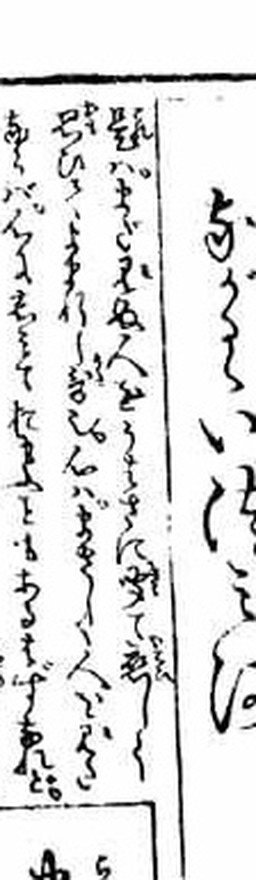これはまだ見ぬ人をうはさに聞て恋しく
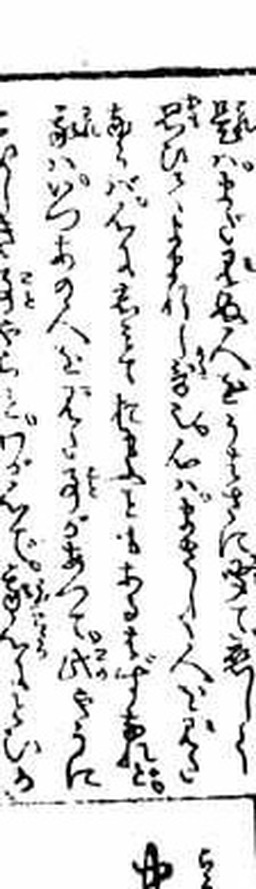ならば心にしみておもふ事があるはずなれど中納
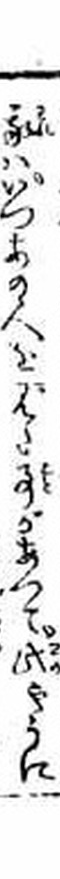我はいつあの人を見た事があつて此やうに言
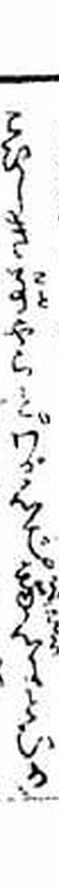こひしき事やらとわが心で我心にとひか
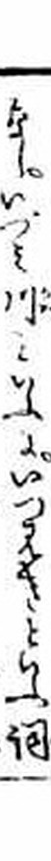なしいづみ川といふにいつ見きといふ詞
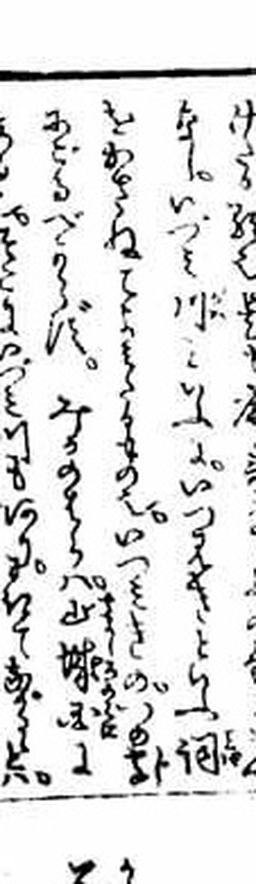をかさねてよみたるもの也いつみきのつの
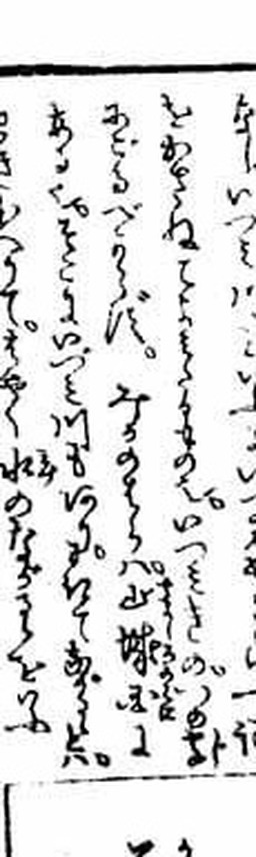字にごるべからずみかのはらは山城国に兼
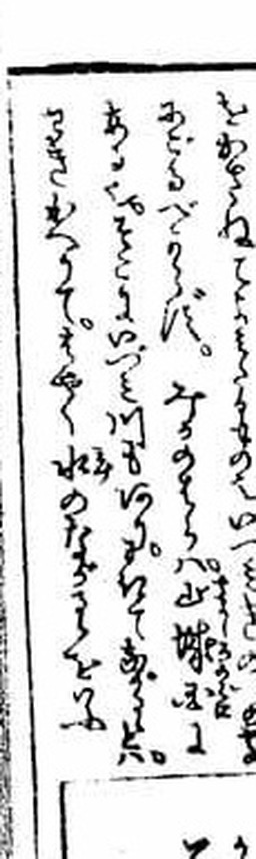ある也そこにいづみ川もありわきてながるゝとは輔
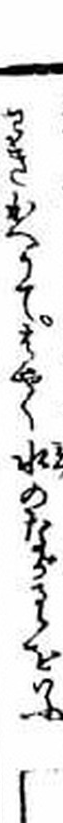わきかへりてはやく水のながるゝをいふ

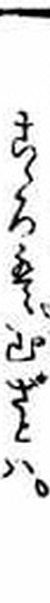こゝろは山ざとは源
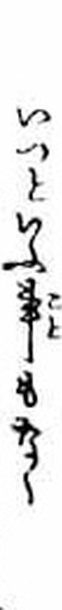いつといふ事もなく宗
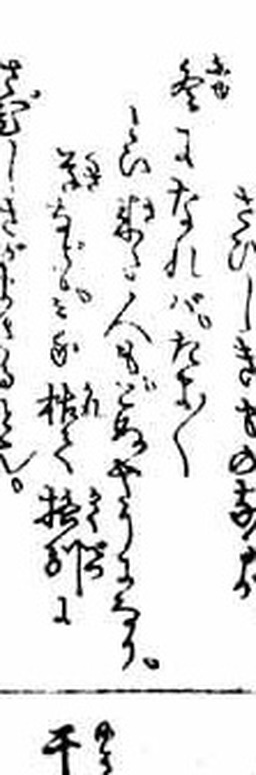とひ來た人もこぬやうになり
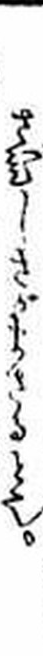さびしさまさると也朝
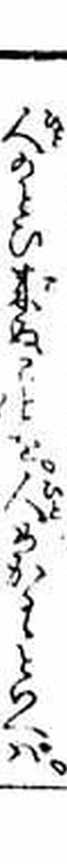人のとひ來ぬことを人めかるゝといはば臣
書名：小倉百人一首
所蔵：東京学芸大学教育コンテンツアーカイブ
